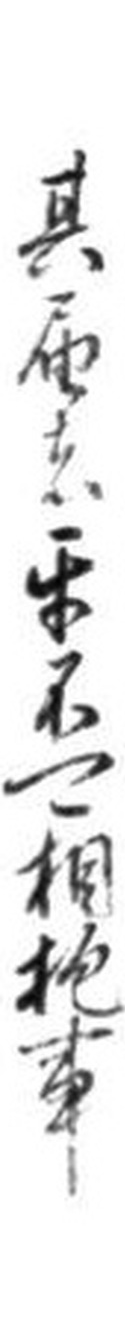其届者互不可相抱事
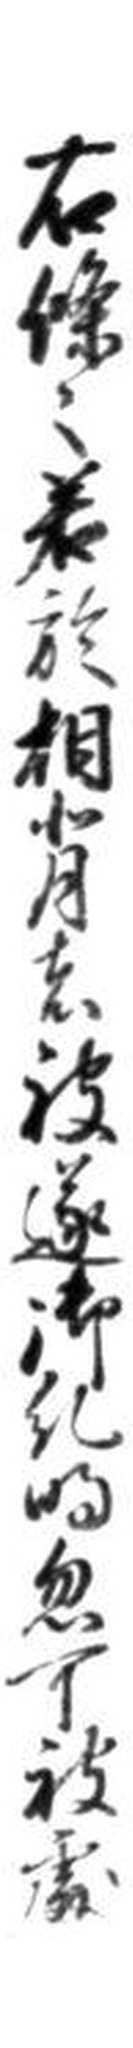右條々若於相背者被遂御糺明忽可被処
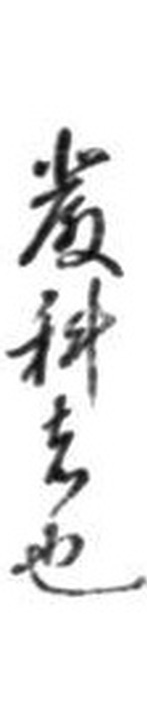厳科者也
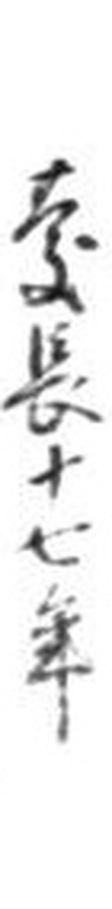慶長十七年
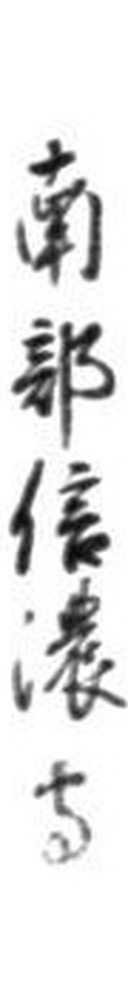南部信濃守
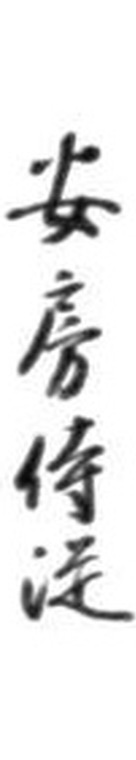安房侍従
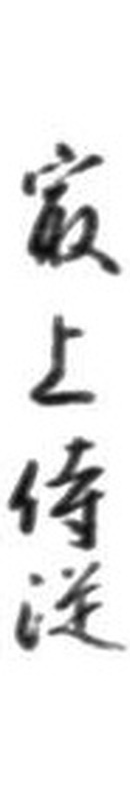最上侍従
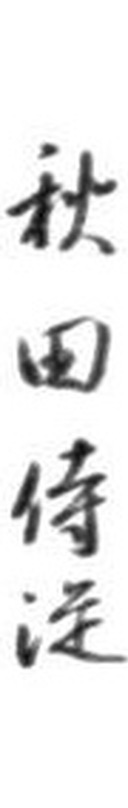秋田侍従
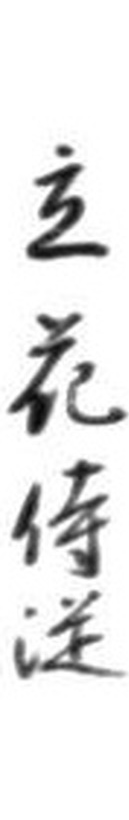立花侍従
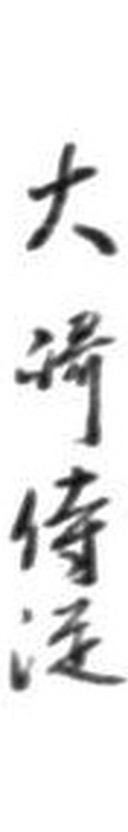大崎侍従
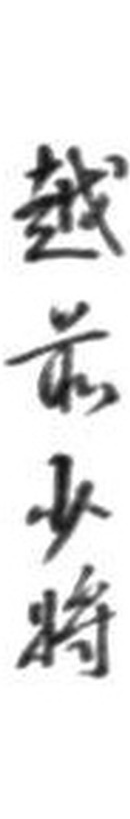越前少将
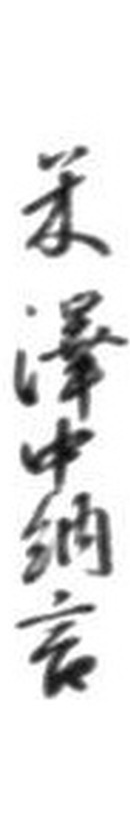米澤中納言

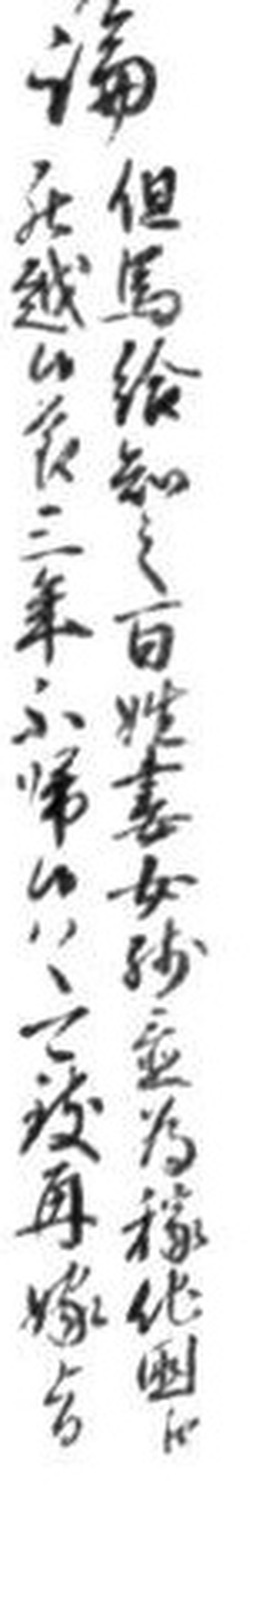罷越候節三年不帰候ハヽ可致再嫁旨
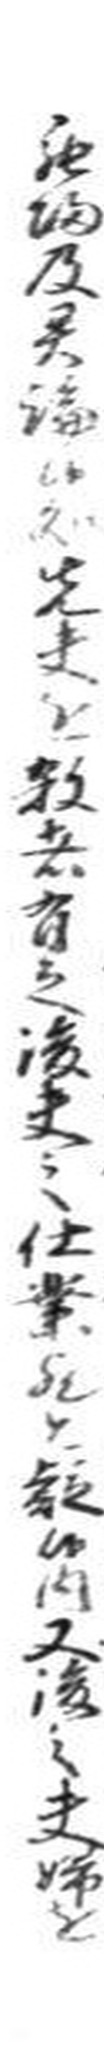罷帰及異論候処先夫を殺者有之後夫之仕業歟と疑候内又後之夫婦を
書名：家譜 二 忠直公 従文禄四年到慶安四年
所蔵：福井県文書館 Fukui Prefectural Archives
